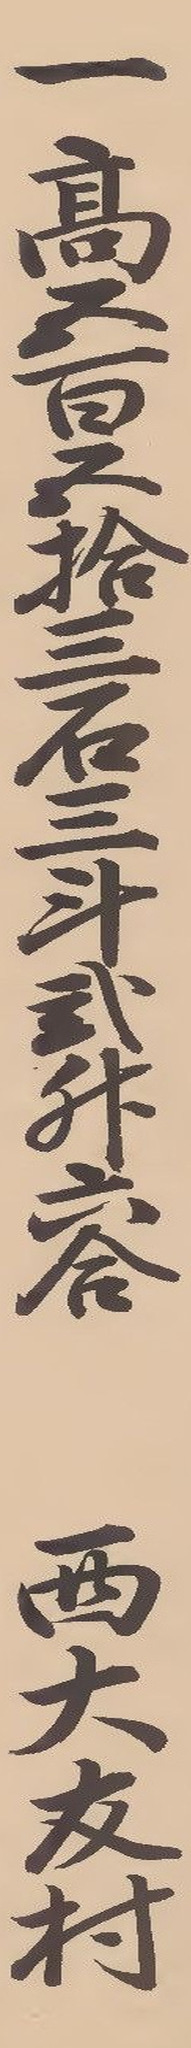一高五百五拾三石三斗弐升六合西大友村
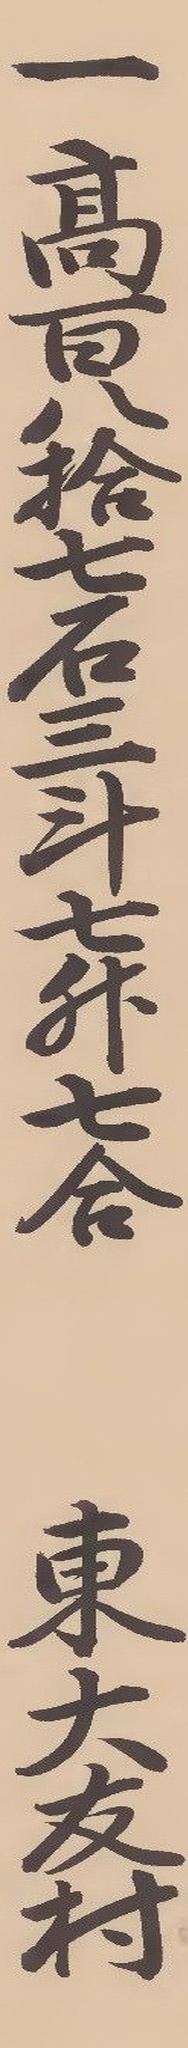一高百八拾七石三斗七升七合東大友村
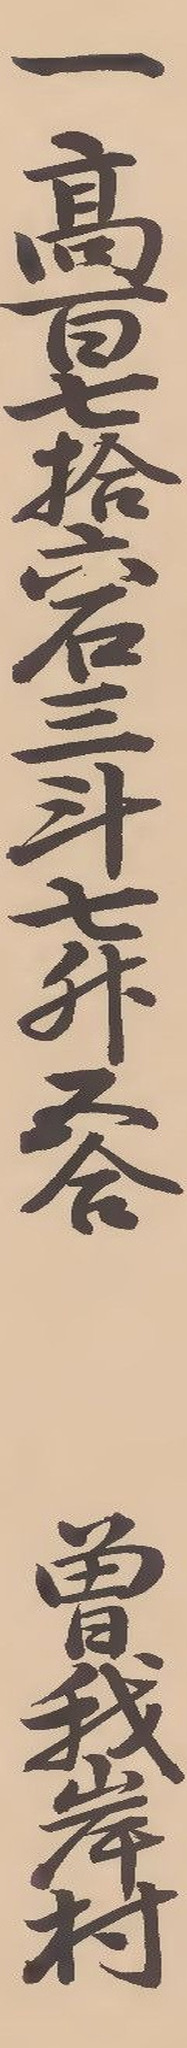一高百七拾六石三斗七升五合曽我岸村
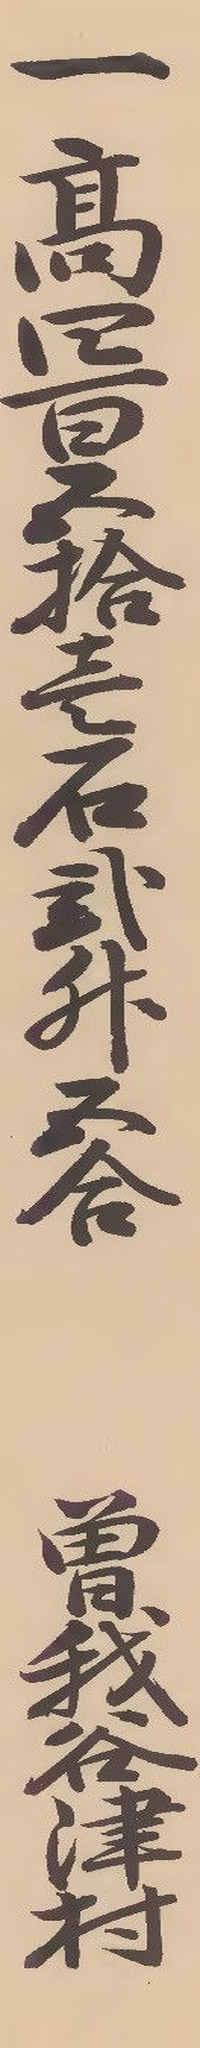一高四百五拾壱石弐升五合曽我谷津村

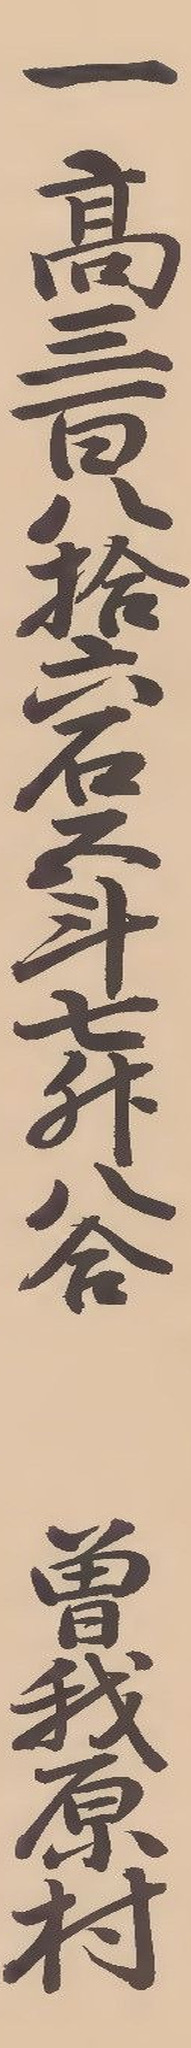一高三百八拾六石五斗七升八合曽我原村
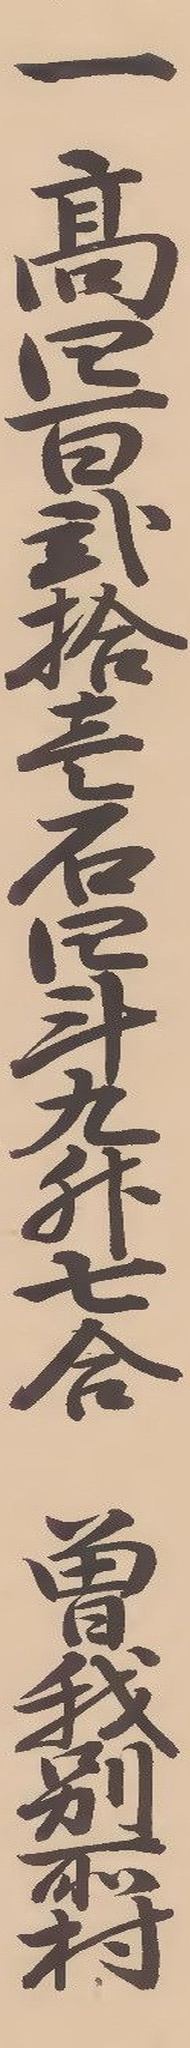一高四百弐拾壱石四斗九升七合曽我別所村
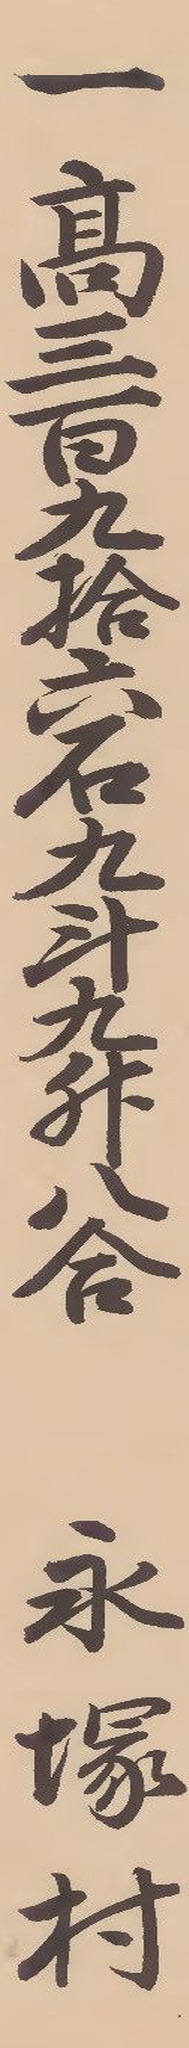一高三百九拾六石九斗九升八合永塚村
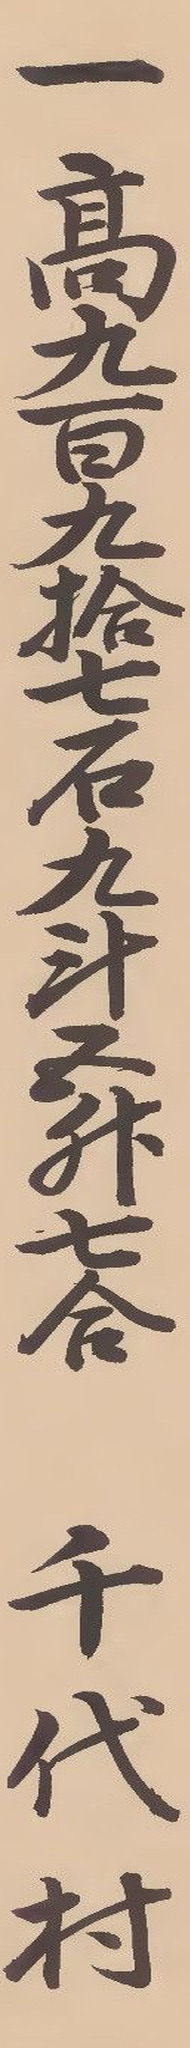一高九百九拾七石九斗五升七合千代村
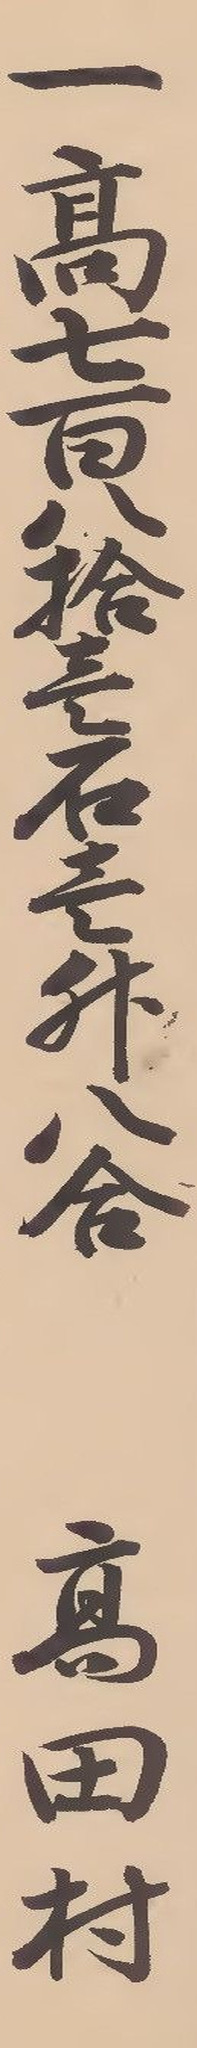一高七百八拾壱石壱升八合高田村
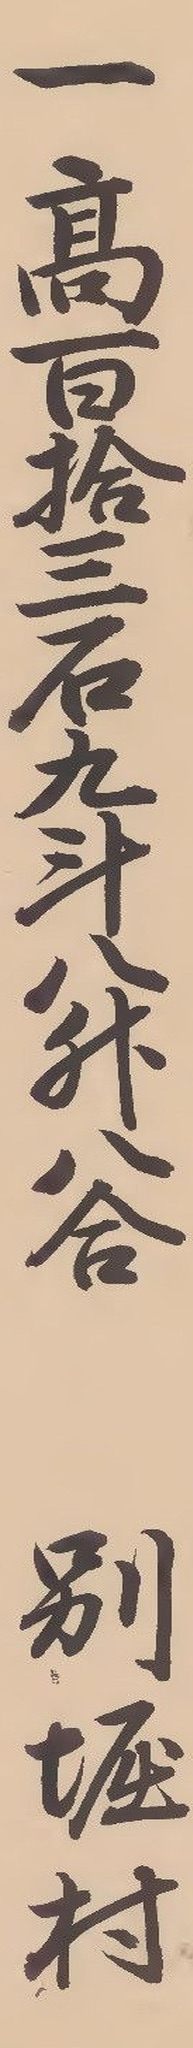一高百拾三石九斗八升八合別堀村
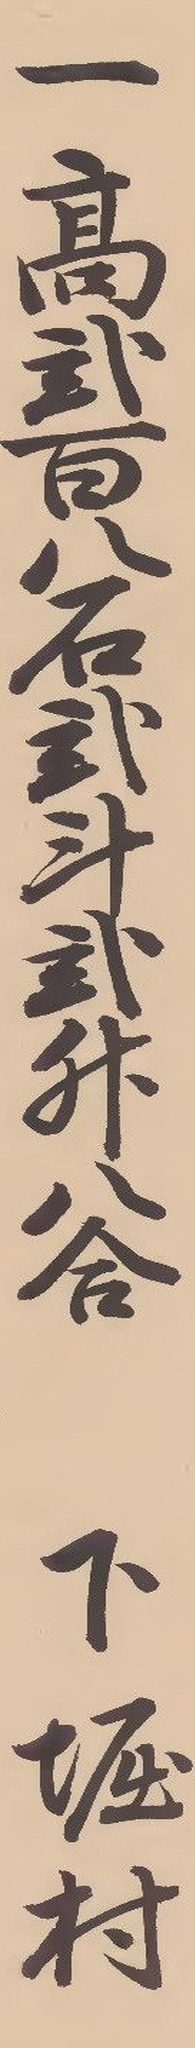一高弐百八石弐斗弐升八合下堀村
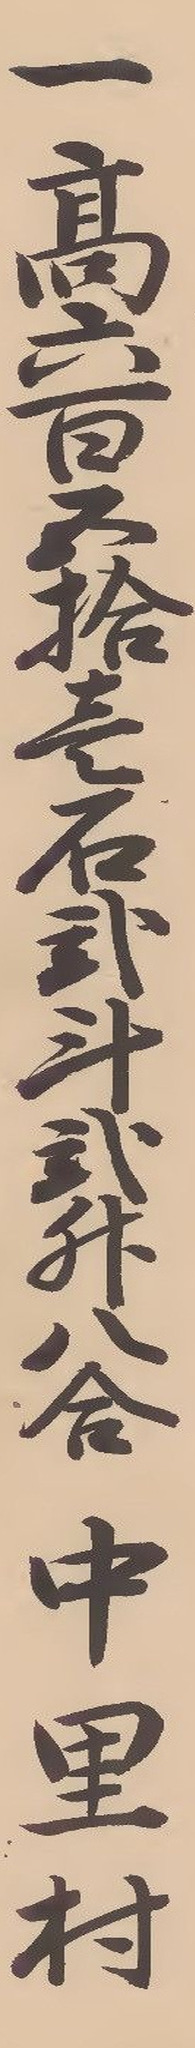一高六百五拾壱石弐斗弐升八合中里村

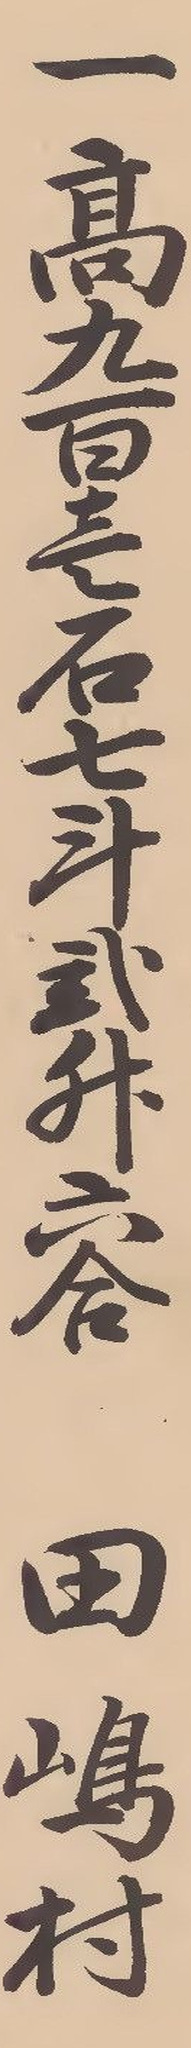一高九百壱石七斗弐升六合田嶋村
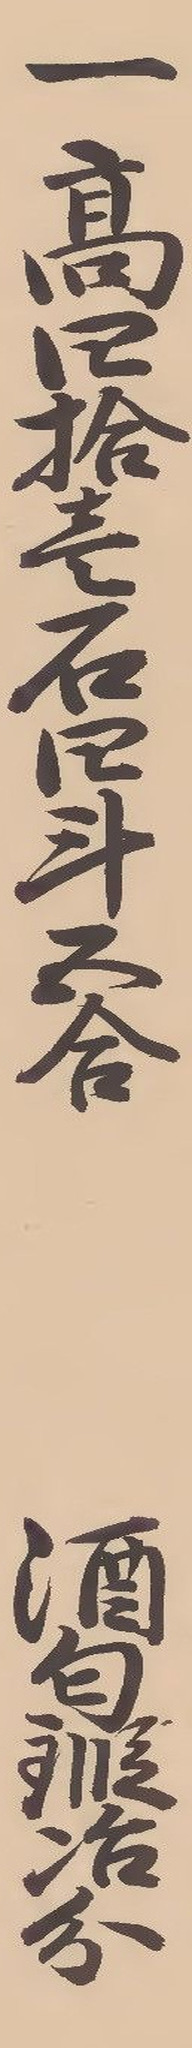一高四拾壱石四斗五合酒匂鍛冶分
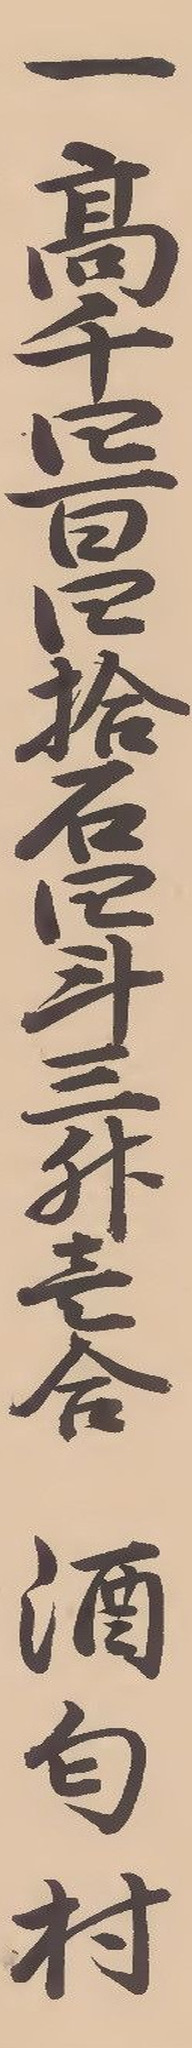一高千四百四拾石四斗三升壱合酒匂村
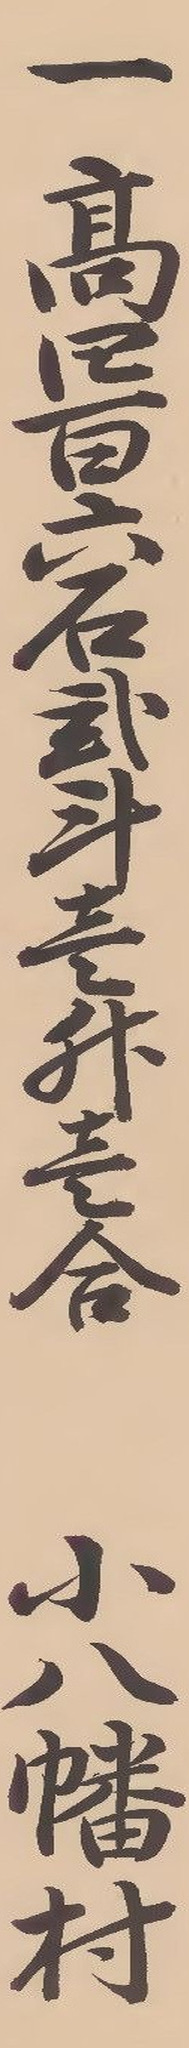一高四百六石弐斗壱升壱合小八幡村
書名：相模国郷帳
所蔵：国立公文書館 National Archives of Japan
